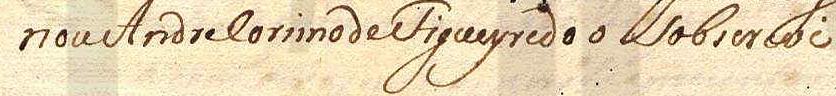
nou Andre Corsino de Figueyredo o Sobscrevi
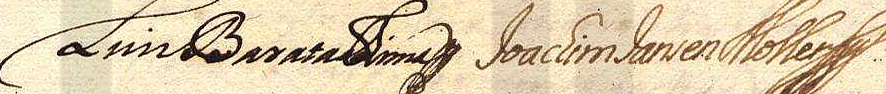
Luiz Barata d̄ lima Ioachim Iansen Moller
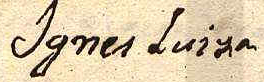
Ignes Luiza
